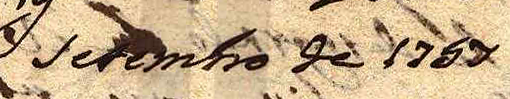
setembro de 1757
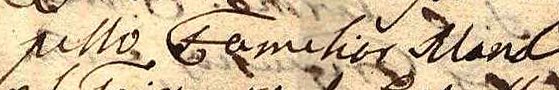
pello Familiar Mano
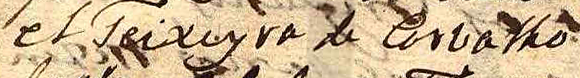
el Teixeyra de Carvalho
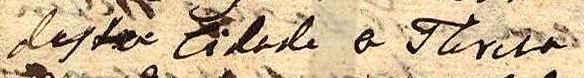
desta Cidade a Thereza
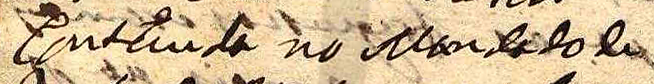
Contheuda no Mandado de
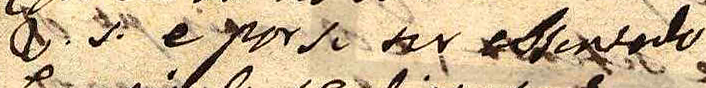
v. s. e por se ter absentado
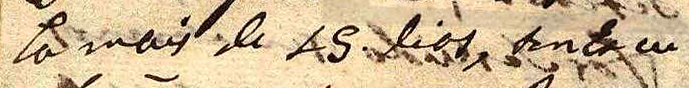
ha mais de 15. dias, tenho eu
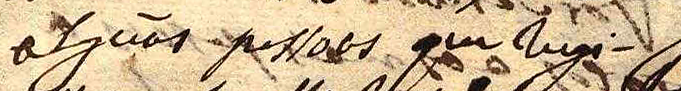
alguãs pessoas que vigi
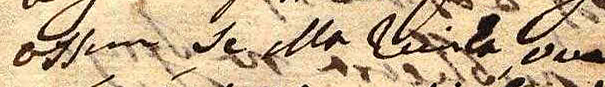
assem se ella vinha, ou
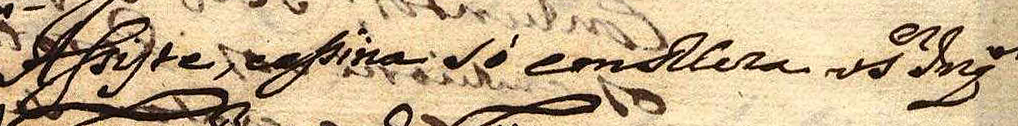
Assiste, e assina só em Meza o sor Inqor
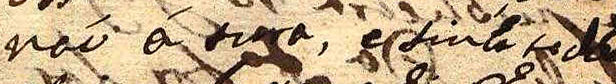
naõ á tera, e tinha todo
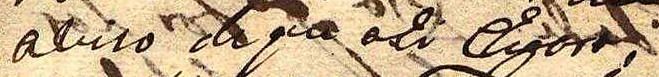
avizo de que ahi Chegara,
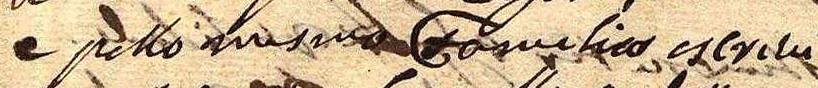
e pello mesmo Familiar escreui
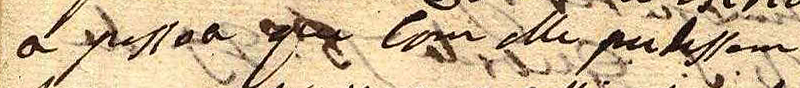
a pessoa que Com elle pudessem
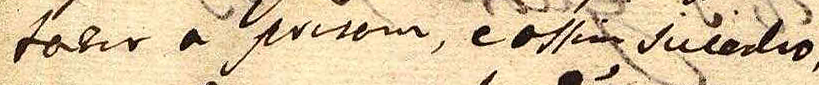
fazer a prizam, e assim sucedeo,
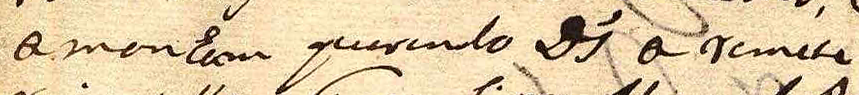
amanham querendo Ds̄ a remete
